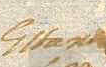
Estan_
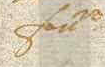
feuro
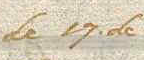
de 17. de
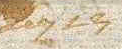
de 713
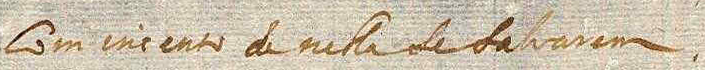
Com intento de nella se salvarem
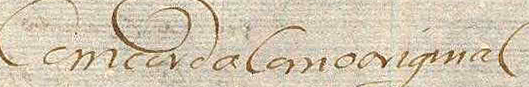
Comcorda Com o original
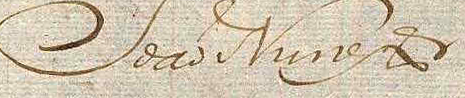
Ioaõ Nunes xer
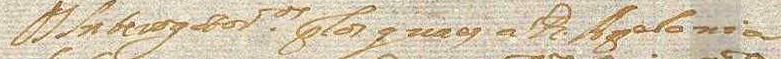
OS Interogator.os plos quaes a R. Apelonia
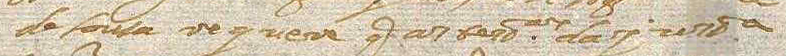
de sousa requere q̄ as test.as da just.a
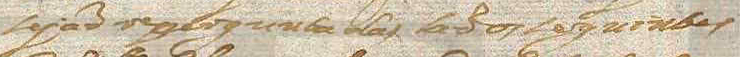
sejaõ reperguntadas saõ os seguintes
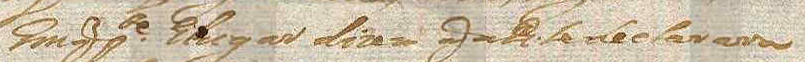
Em q̄ pte. E lugar dizem q̄ a R. se declarara
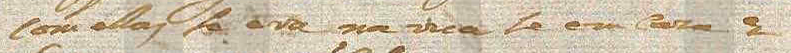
com ellas se era na rua se em caza E
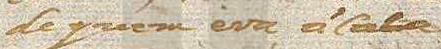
de quem era á casa
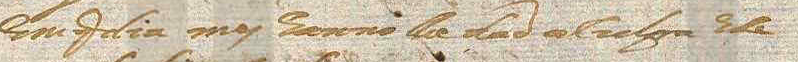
Em q̄ dia mes E anno lhe daõ a Culpa E se
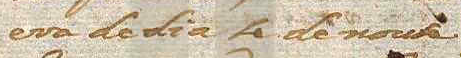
era de dia se de noute.
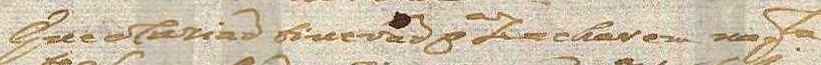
Que ocaziaõ tiueraõ pa se acharem naq.la
